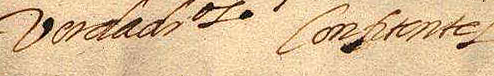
verdadros Confitentes
